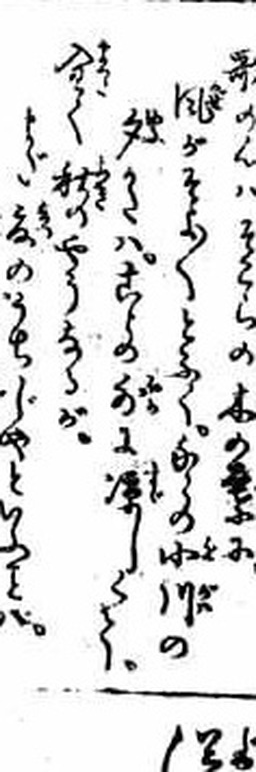夕かたはことの外に涼しくて
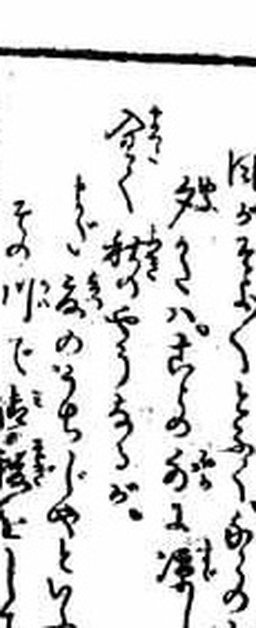て秋のやうなるが
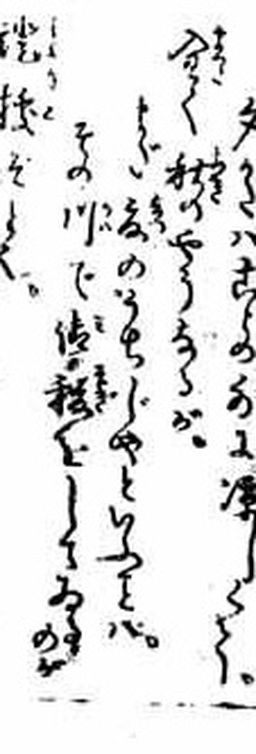まだ夏のうちじやといふと也
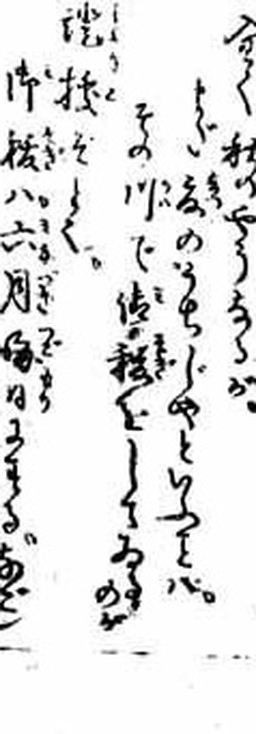その川で御禊をしてゐるのが
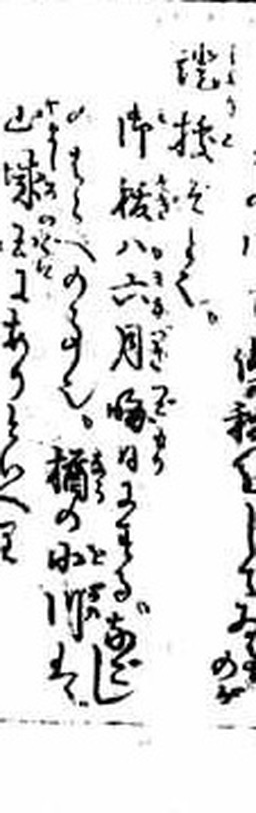御禊は六月晦日にするなごし家
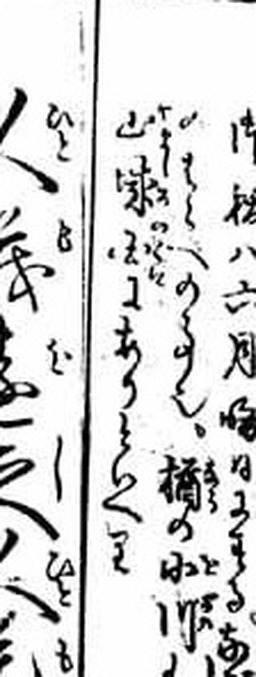山城国にありといへり
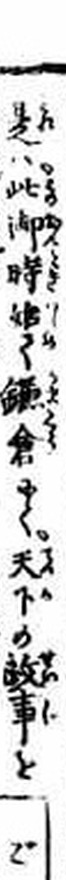是は此の御時始めて鎌倉にて天下の政事を
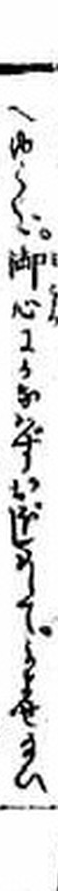へゆくを御心にかなはずおぼしめしてよませ給ひ
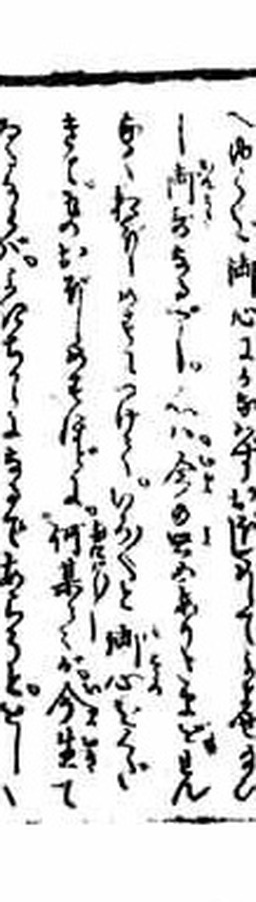なくおぼしめしすにつけていろ〳〵と御心をくだ
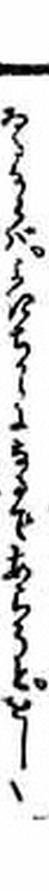ゐるならばよきちからにならであらうとをしく
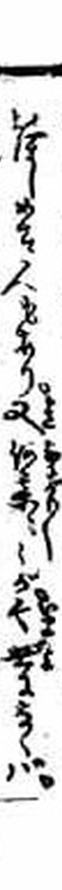おぼしめす人もあり又何某〳〵が世になくば
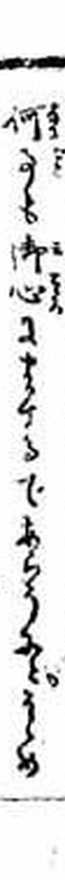何事も御心にまさるであらうにとうらめ
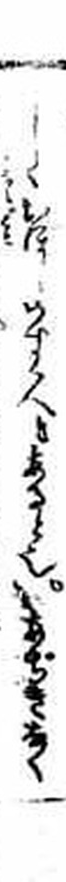しくおぼしめす人もあると也あぢきなく院

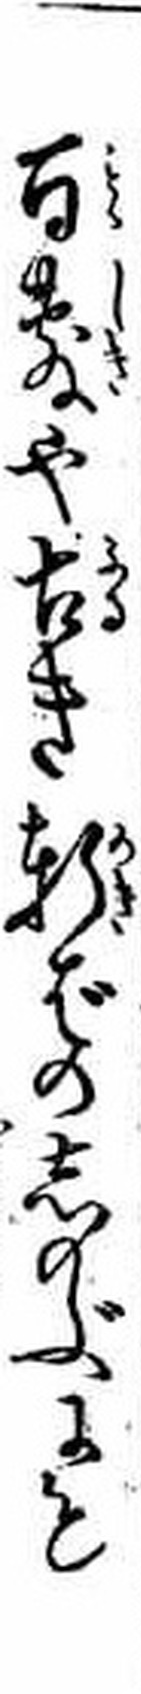百敷や古き軒端のしのぶにも
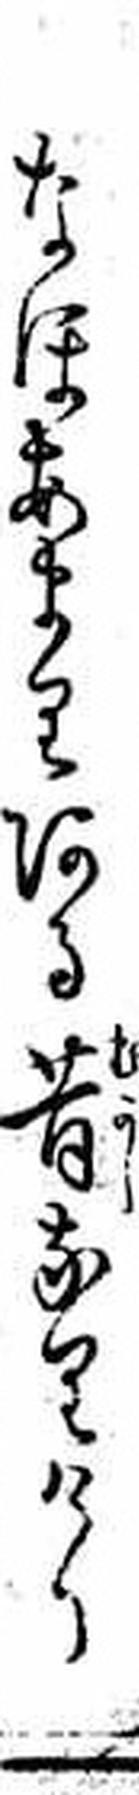なほあまりあるむかしなりけり
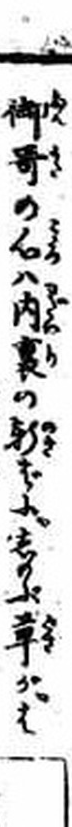御哥の心は内裏の軒ばにしのぶ草がは
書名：小倉百人一首
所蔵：東京学芸大学教育コンテンツアーカイブ
